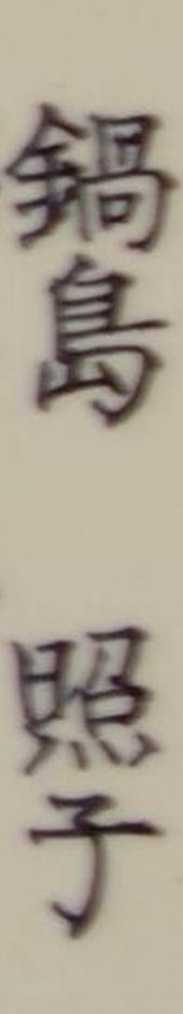鍋島照子
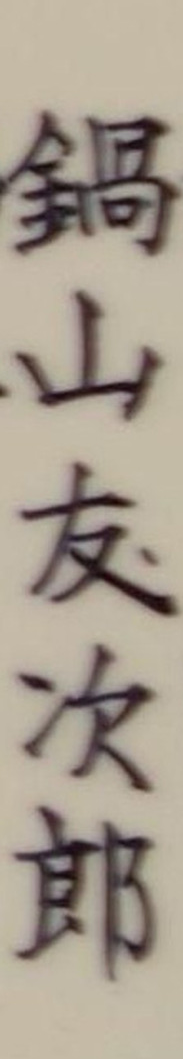鍋山友次郎
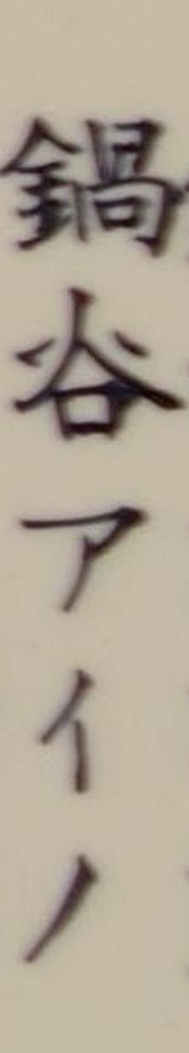鍋谷アイノ
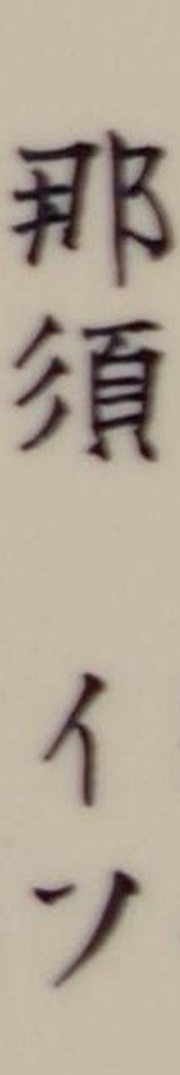那須イソ
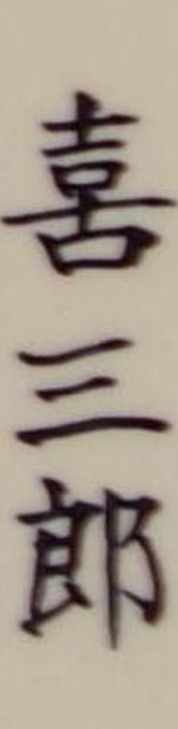喜三郎
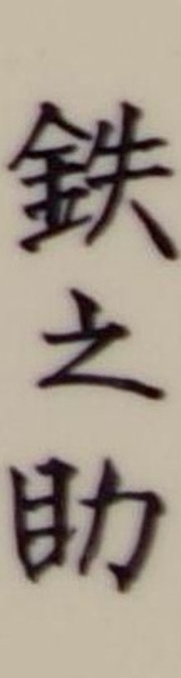鉄之助
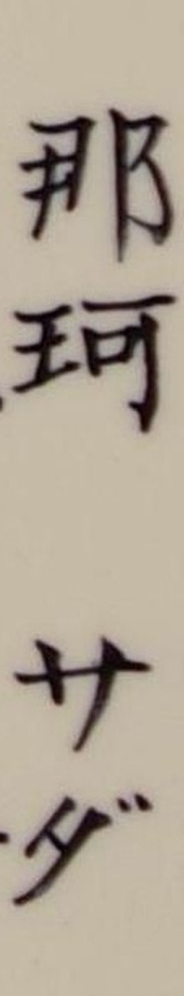那珂サダ
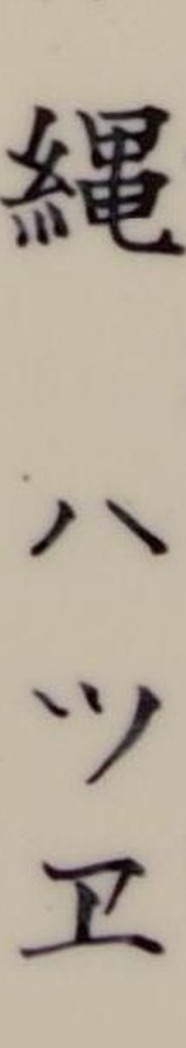縄ハツエ
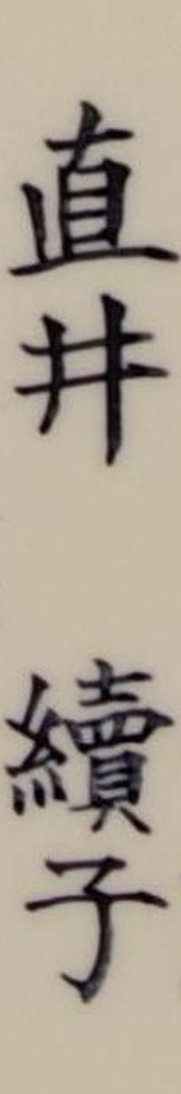直井続子
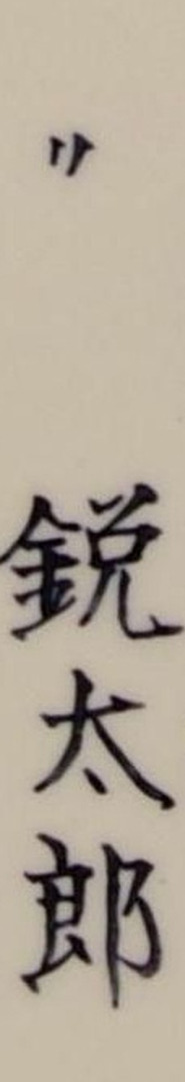鋭太郎
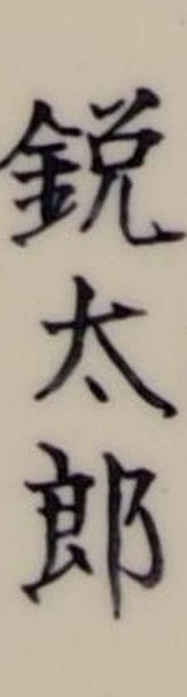鋭太郎
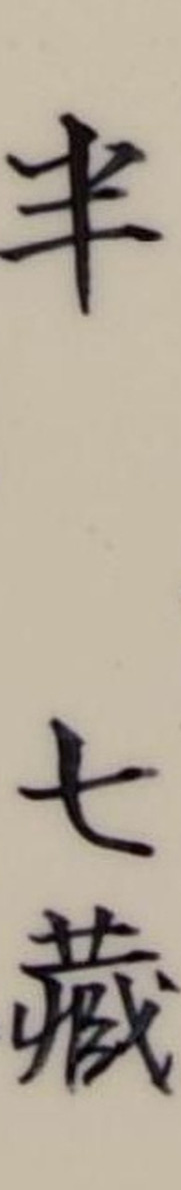半七蔵
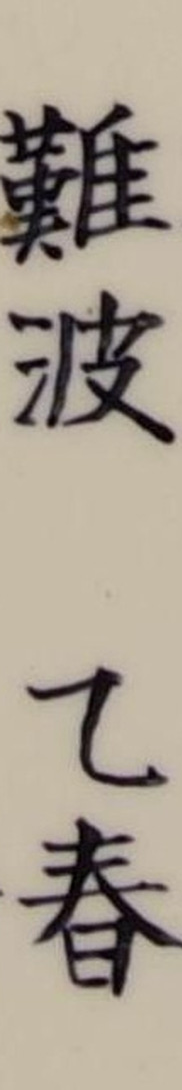難波乙春
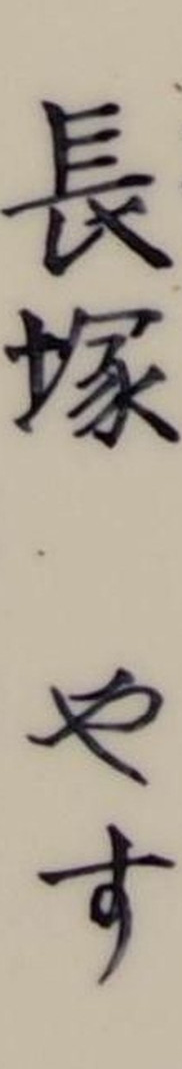長塚やす
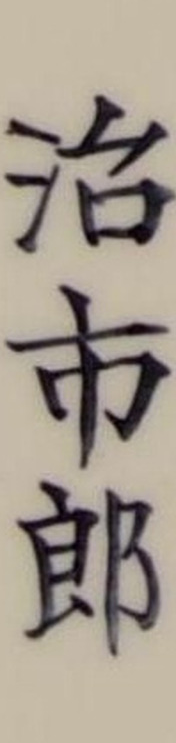治市郎
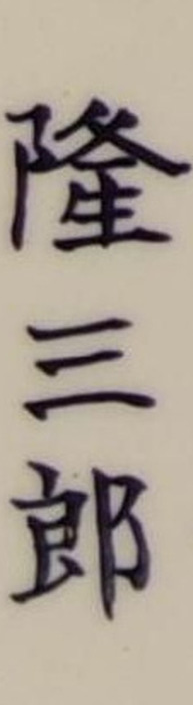隆三郎
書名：M~S
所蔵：高野山金剛峯寺
